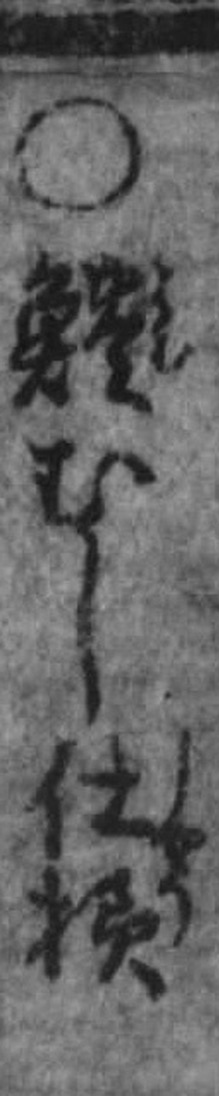○鱧むし仕様
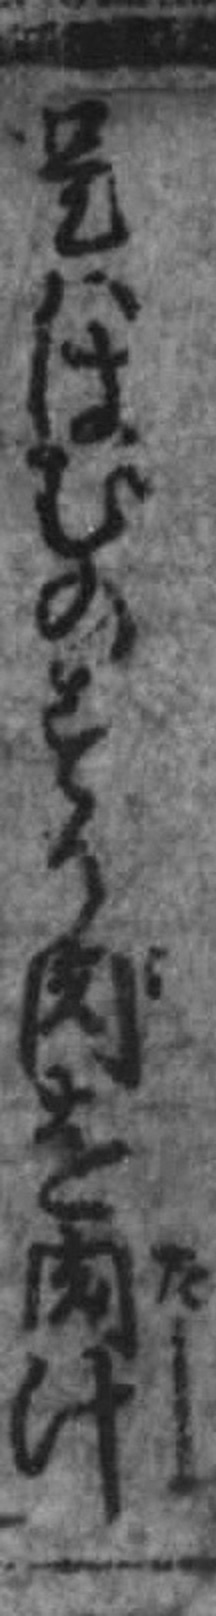是ははむのすり肉を肉汁
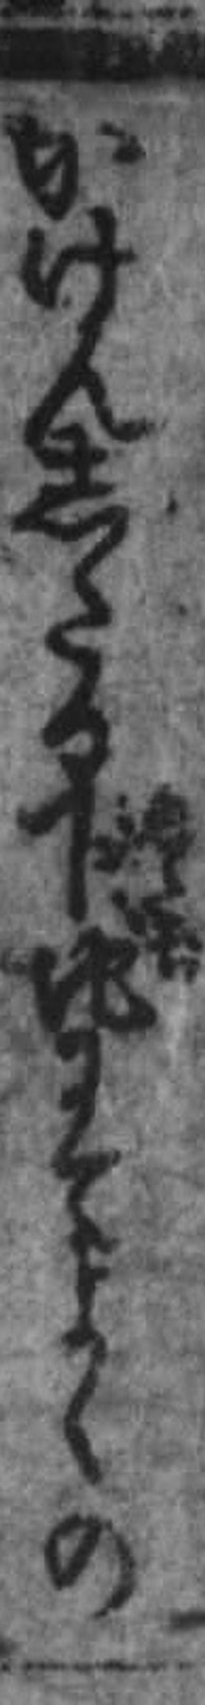かけんしたる下地にてよくの
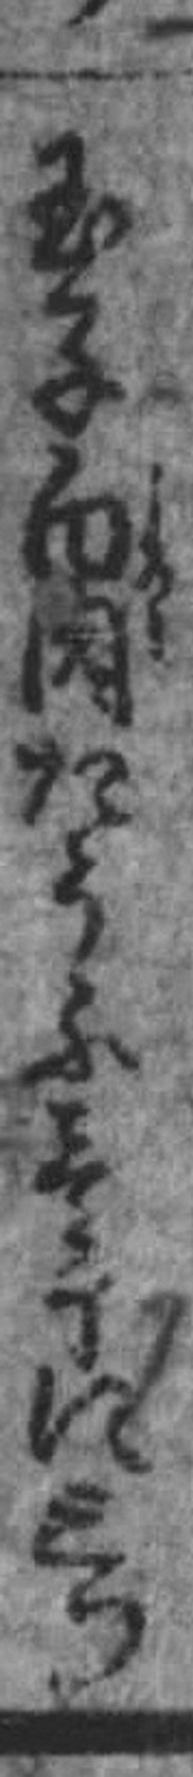玉子白肉たうふ壱丁にとり
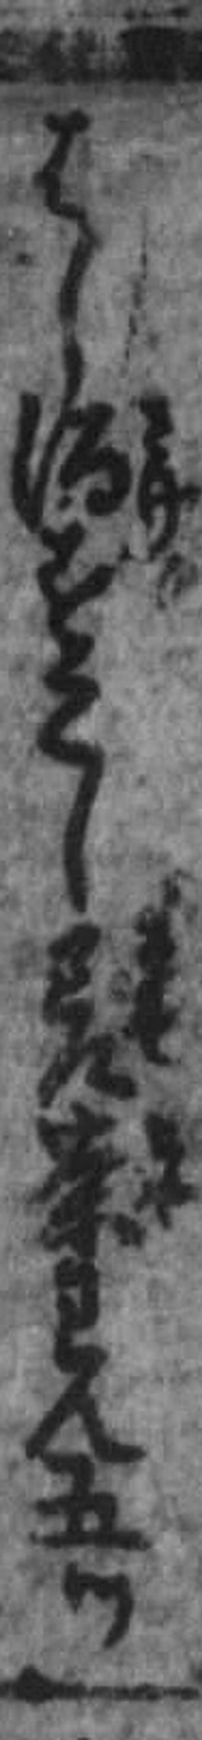はし酒すこし差茶わん五つ
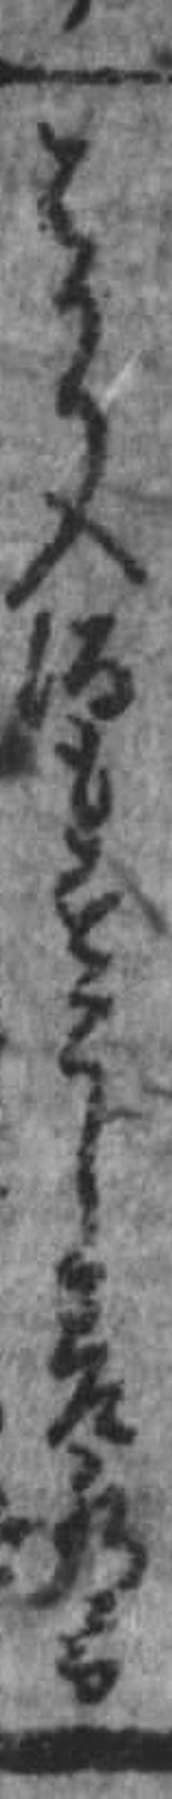はかり入酒もすこし差水にて
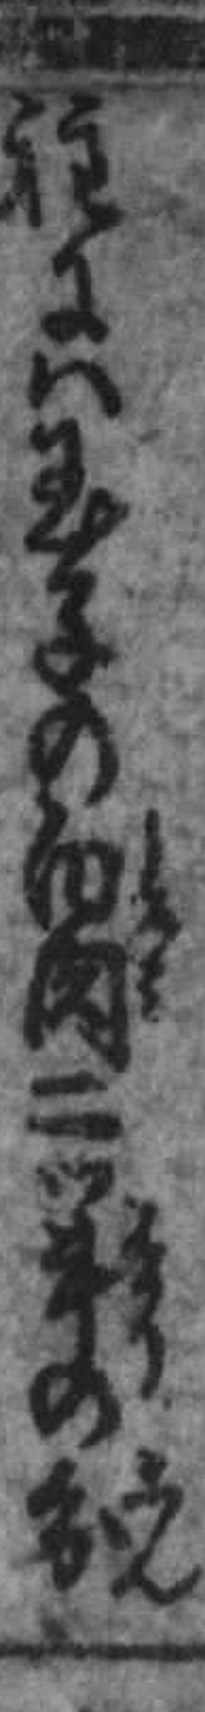程には玉子の白肉二つ斗の分
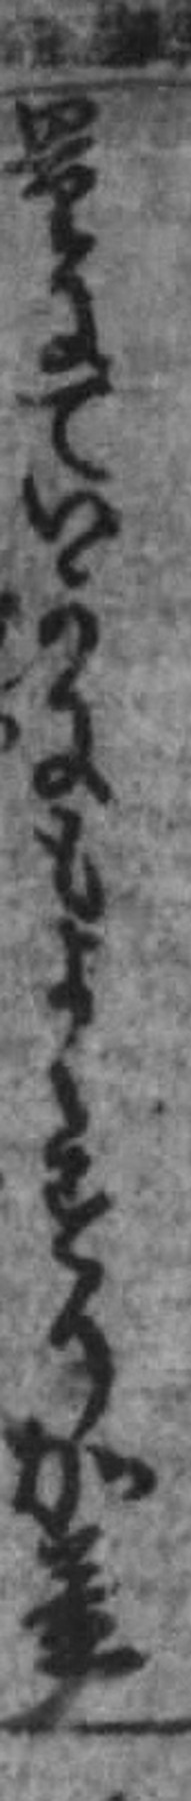量にていかにもよくすり加益
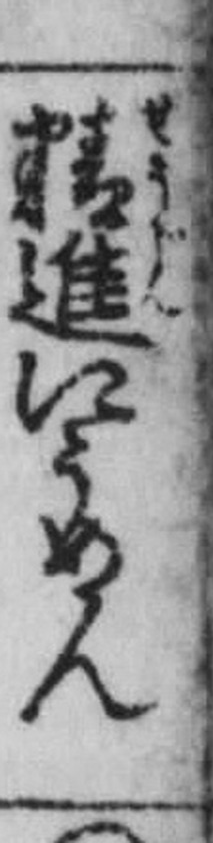精進にうめん
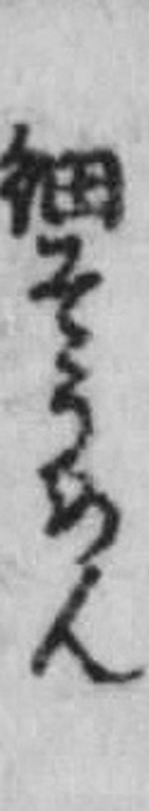細そうめん
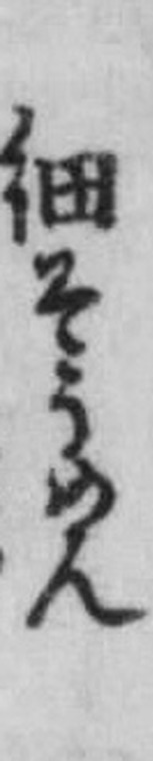細そうめん
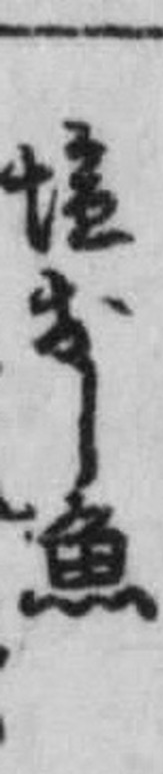塩おし魚
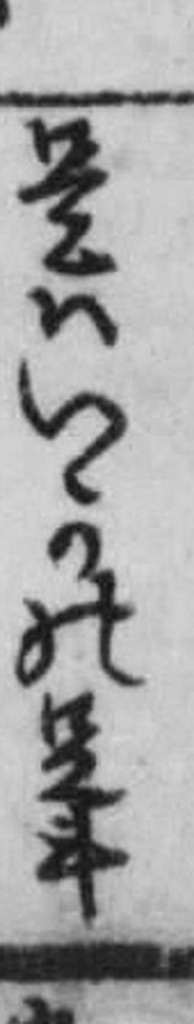是はいかの足斗
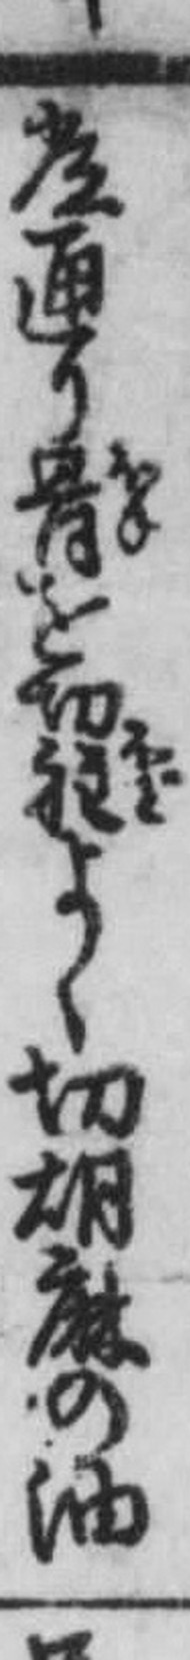常通り骨を切程よく胡麻の油
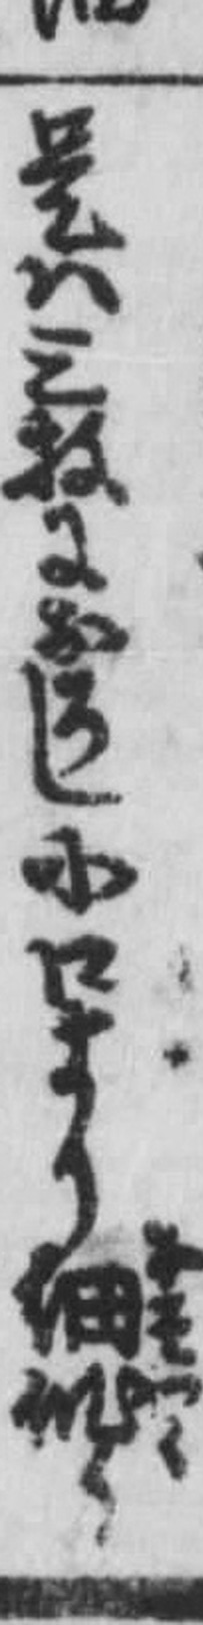是は三枚におろし小口より細作り
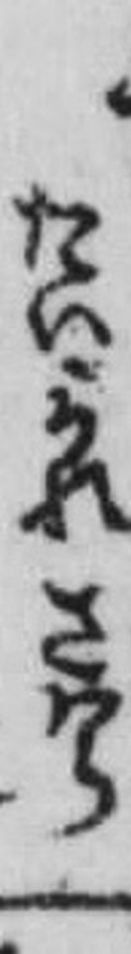たいかれさわら
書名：精進魚類間合料理/早速庖丁
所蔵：大阪府立大学学術情報センター 国文学研究資料館
